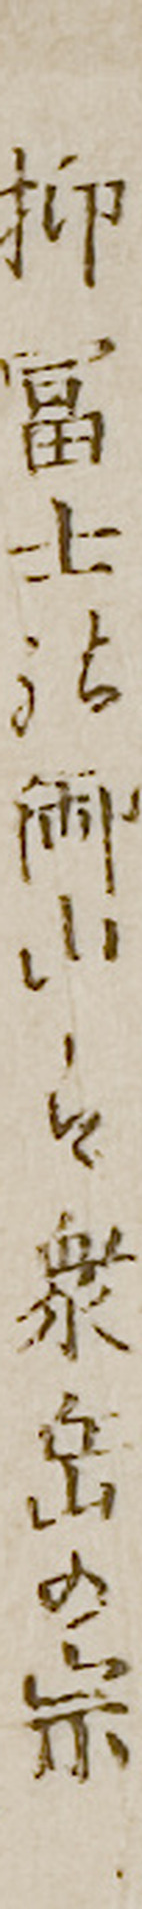抑富士の御山は衆岳の宗
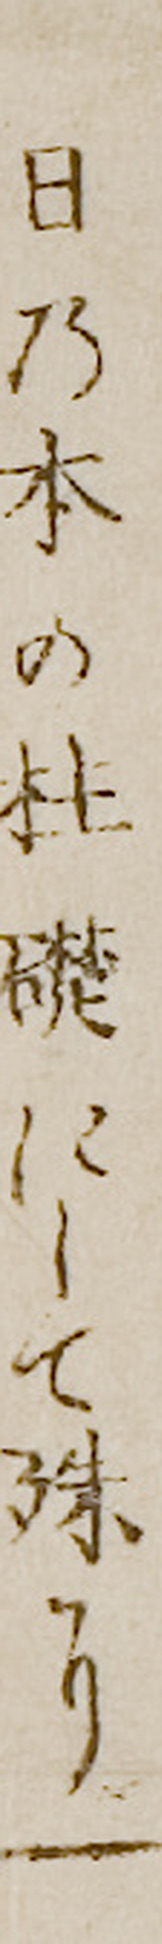日乃本の柱礎にして殊に
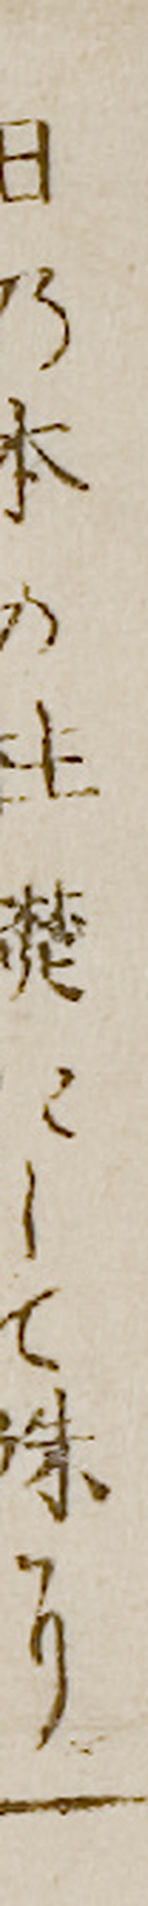日乃本の柱礎にして殊に
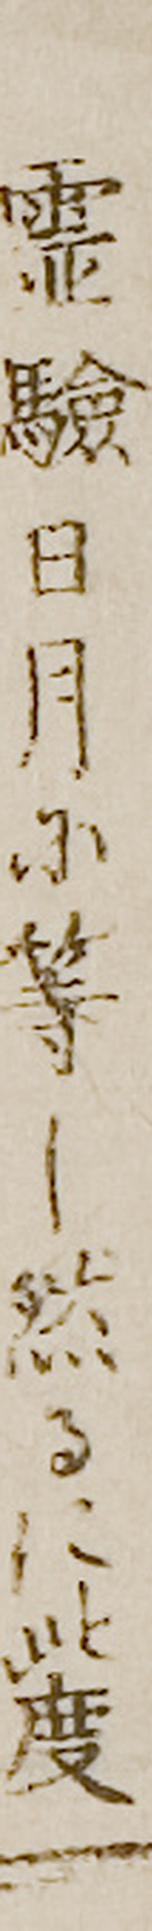霊験日月に等し然るに此度
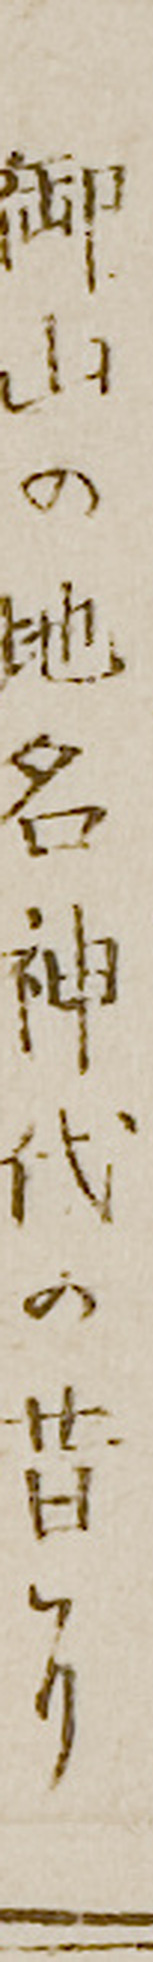御山の地名神代の昔に
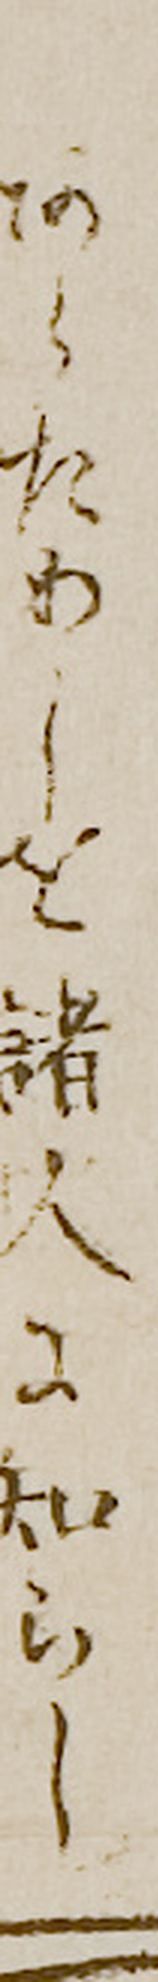あらためしを諸人に知らし
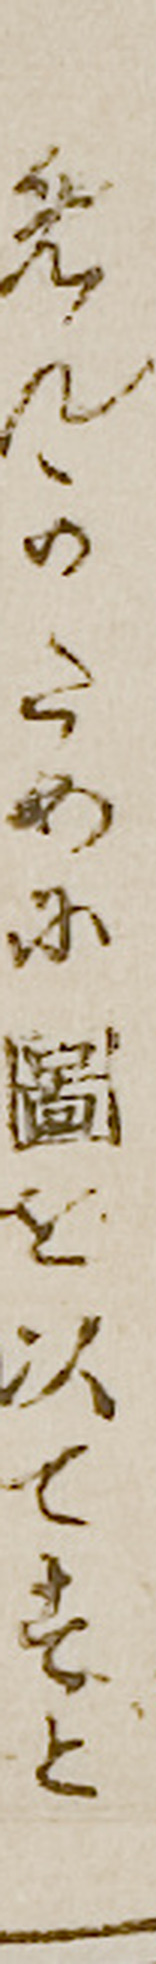めんかために図を以てすと云云
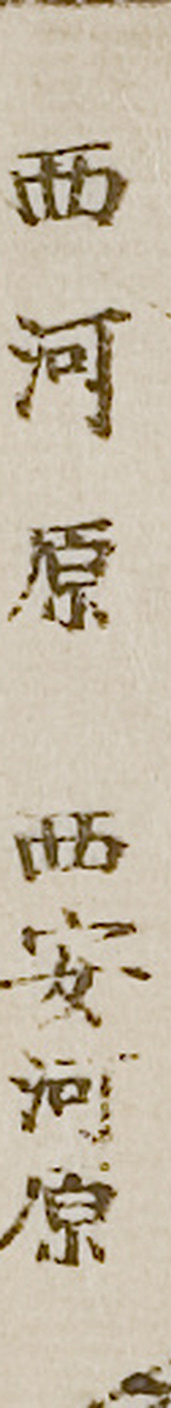西河原西安河原
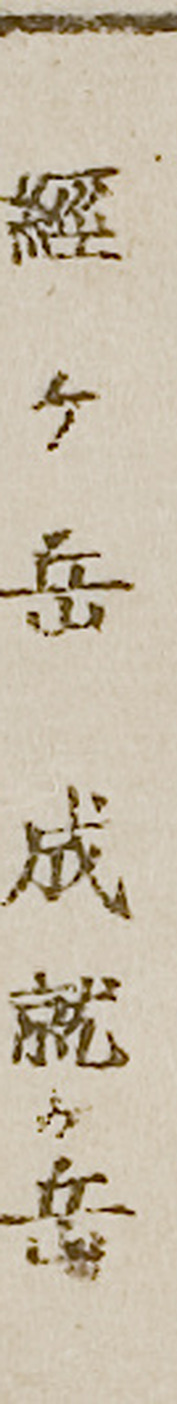経ヶ岳成就ヶ岳
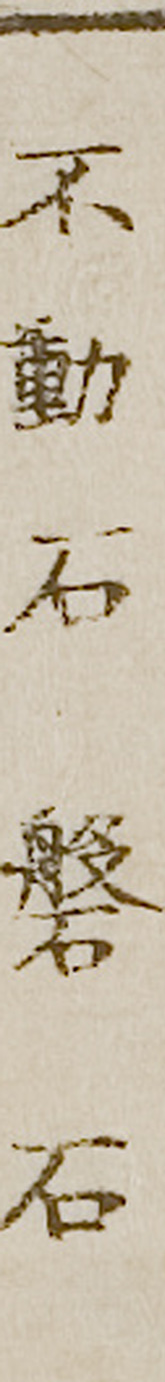不動石磐石
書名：[富士山之図]
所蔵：東京大学総合図書館 General Library in the University of Tokyo, JAPAN
